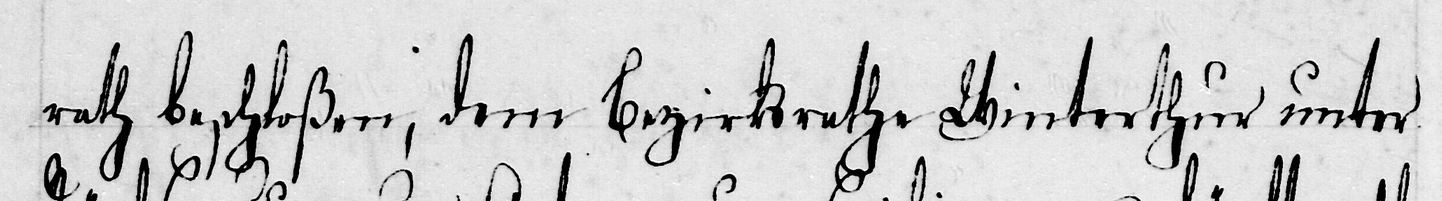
rath beschloßen, dem Bezirksrathe Winterthur unter
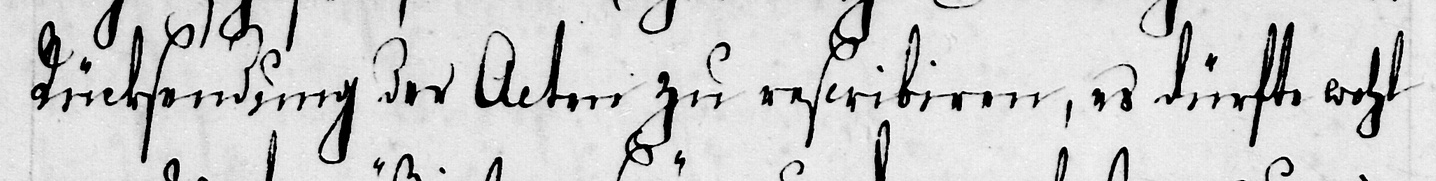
Rücksendung der Acten zu rescribiren, es dürfte wohl
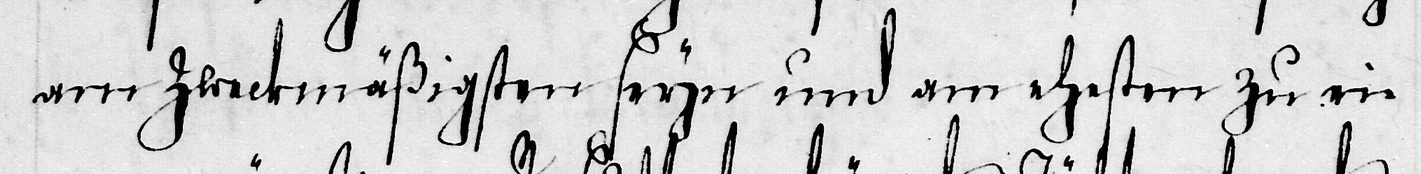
am zweckmäßigsten seyn und am ehesten zu ei¬
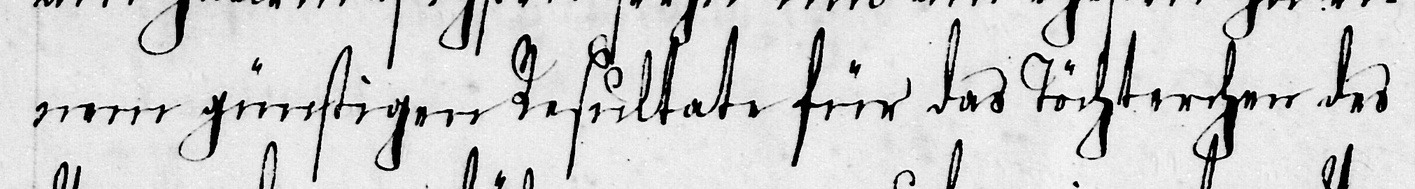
nem günstigen Resultate für das Töchterchen des
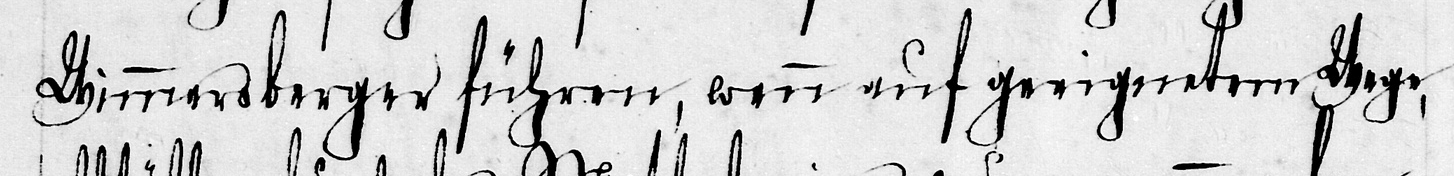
Wimmersberger führen, wenn auch geeignetem Wege,
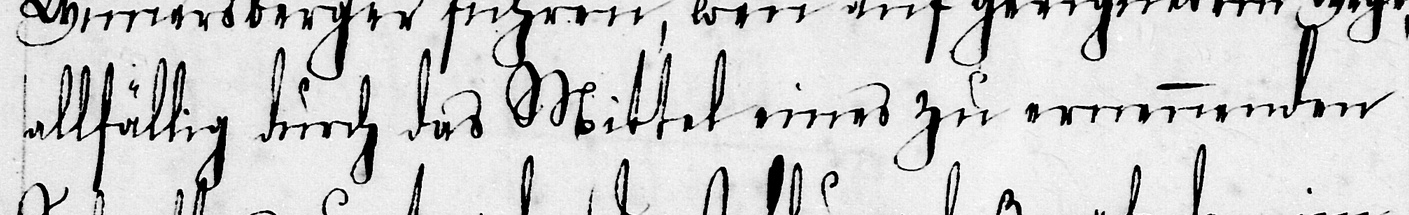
allfällig durch das Mittel eines zu ernennenden
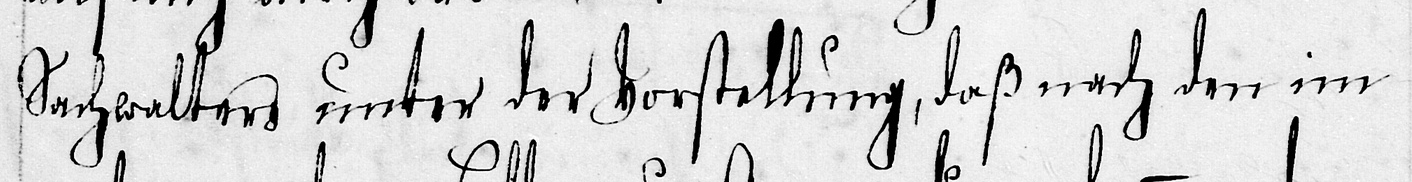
Sachwalters unter der Vorstellung, daß nach den im
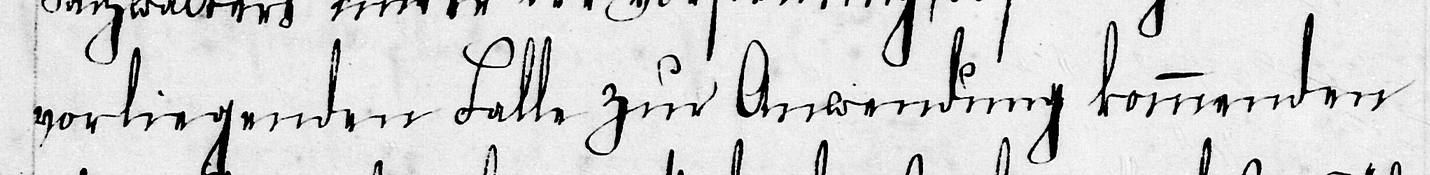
vorliegenden Falle zur Anwendung kommenden
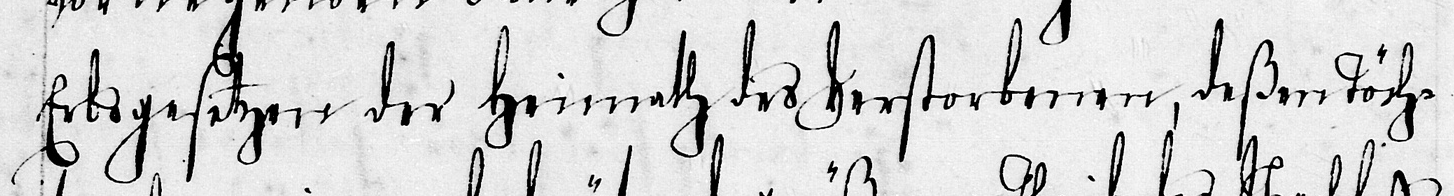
Erbsgesetzen der Heimath der Verstorbenen, deßen Töch¬
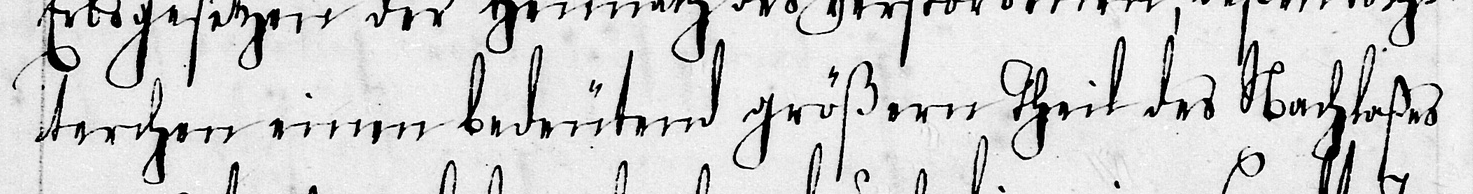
terchen einen bedeutend größern Theil des Nachlaßes
